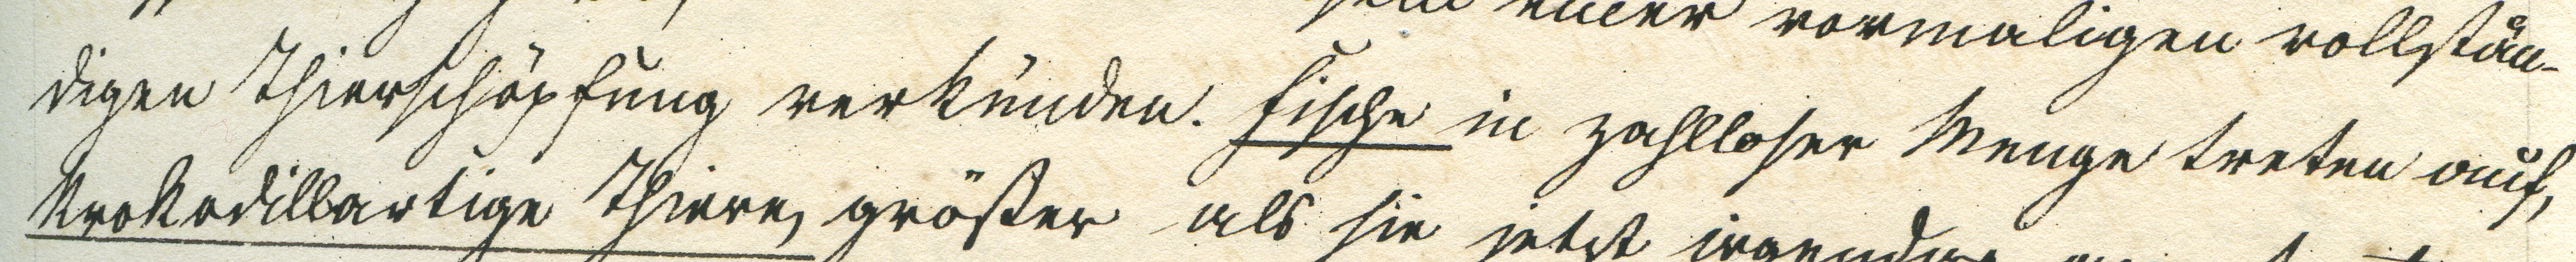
digen Thierschöpfung verkünden. Fische in zahlloser Menge treten auf,
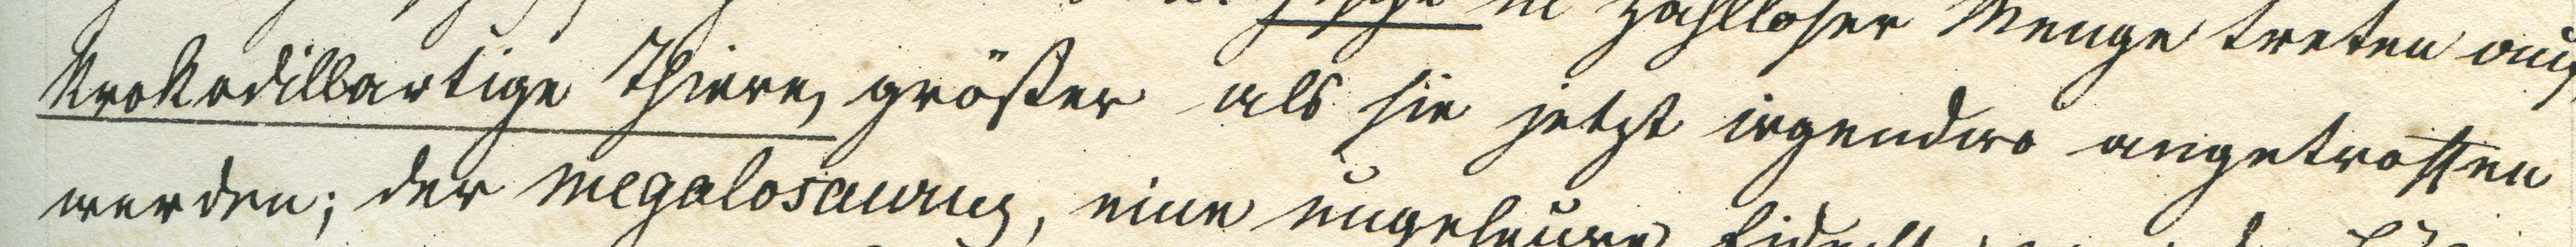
krokodillartige Thiere, größer als sie jetzt irgendwo angetroffen
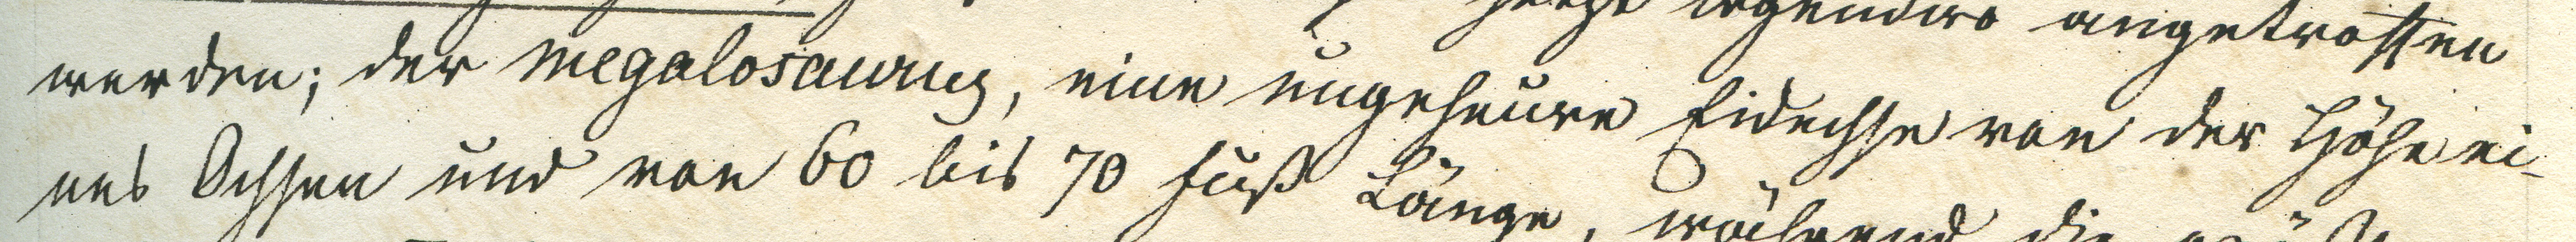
werden; der megalosaurus, eine ungeheure Eidechse von der Höhe ei-
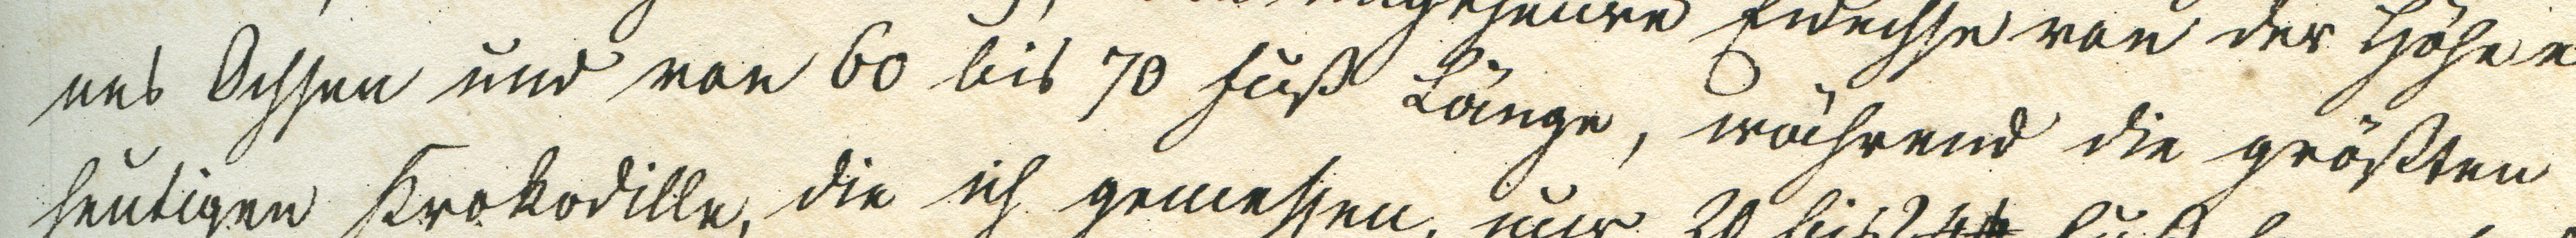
nes Ochsen und von 60 bis 70 Fuß Länge, während die größten
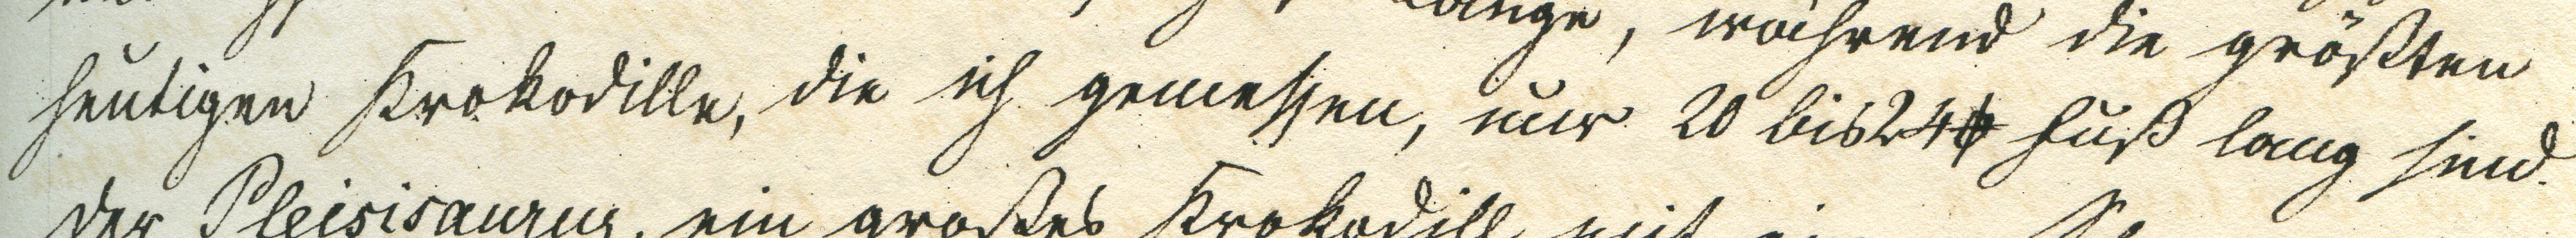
heutigen Krokodille, die ich je gemessen, nur 20 bis 240 Fuß lang sind.
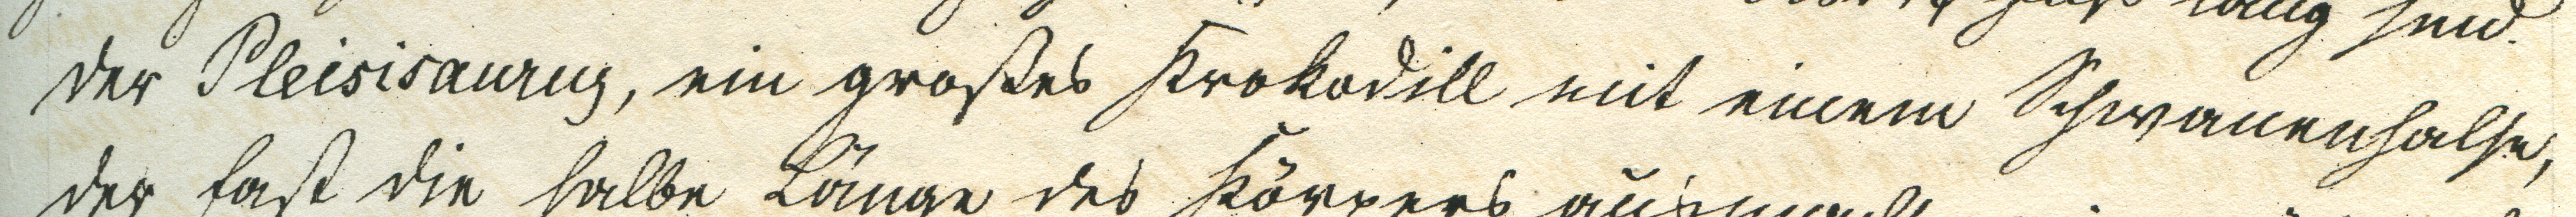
Der Pleisiosaurus, ein großes Krokodill mit einem Schwanenhalse,
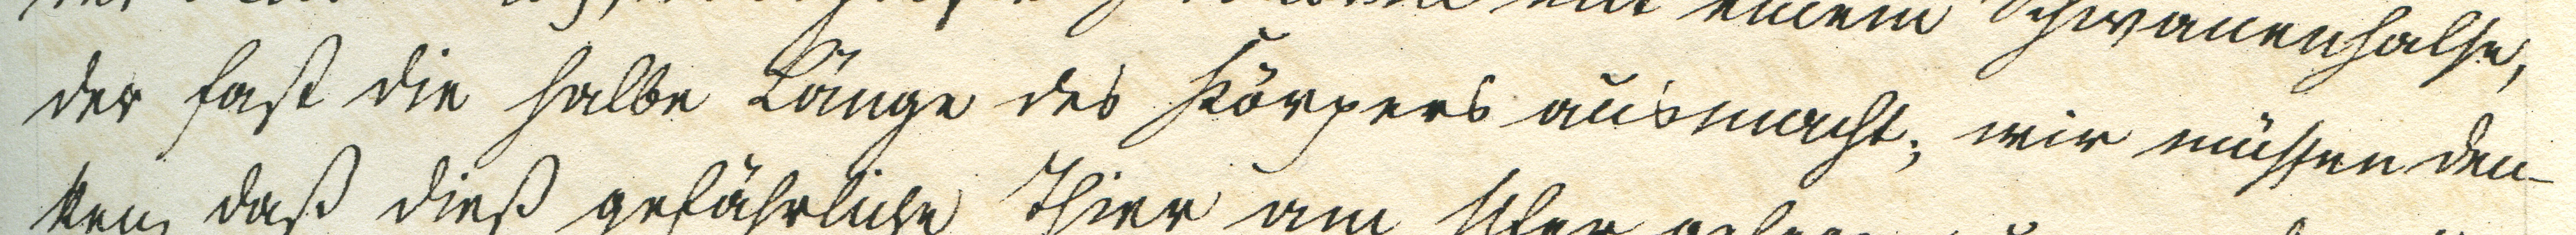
der fast die halbe Länge des Körpers ausmacht; wir müssen den-
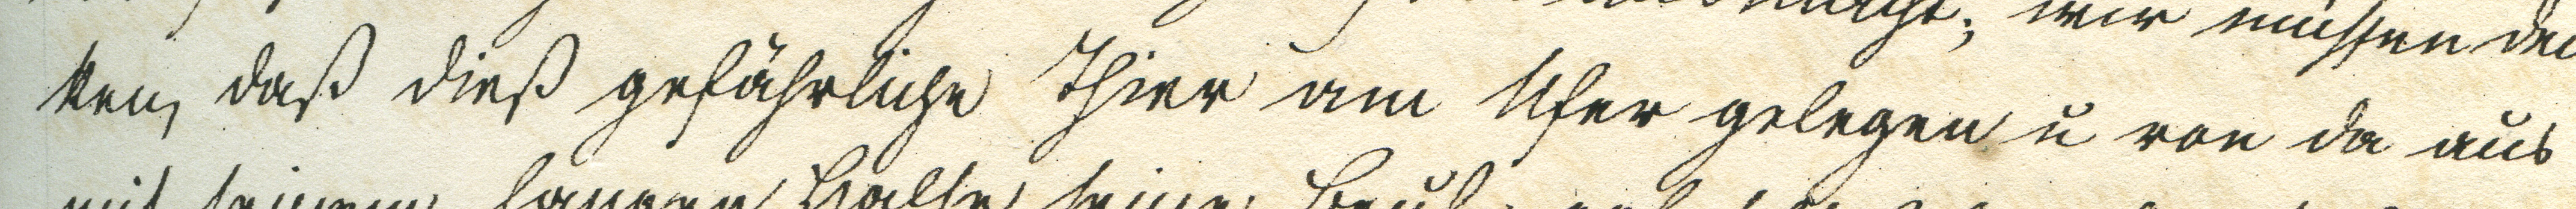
ken, daß dieß gefährliche Thier am Ufer gelegen u von da aus
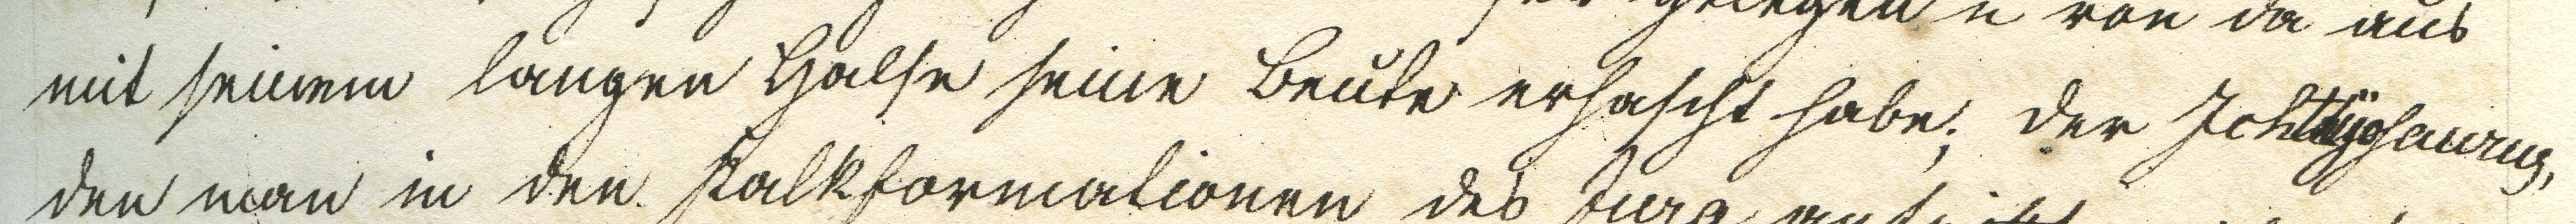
mit seinem langen Halse seine Beute erhascht habe; der Ichathÿosaurus,
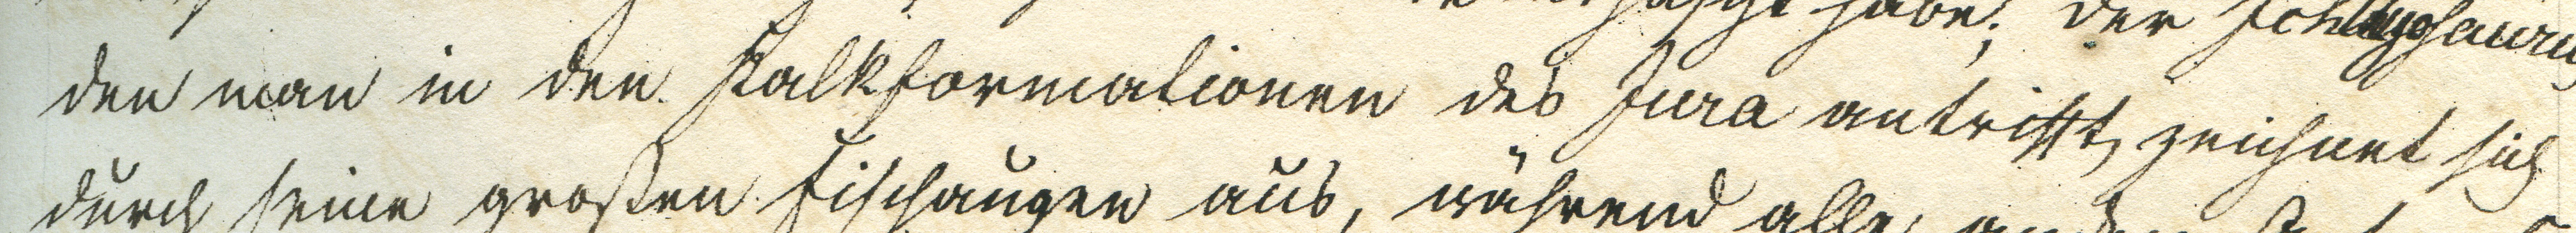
den man in den Kalkformationen des Jura antrifft, zeichnet sich
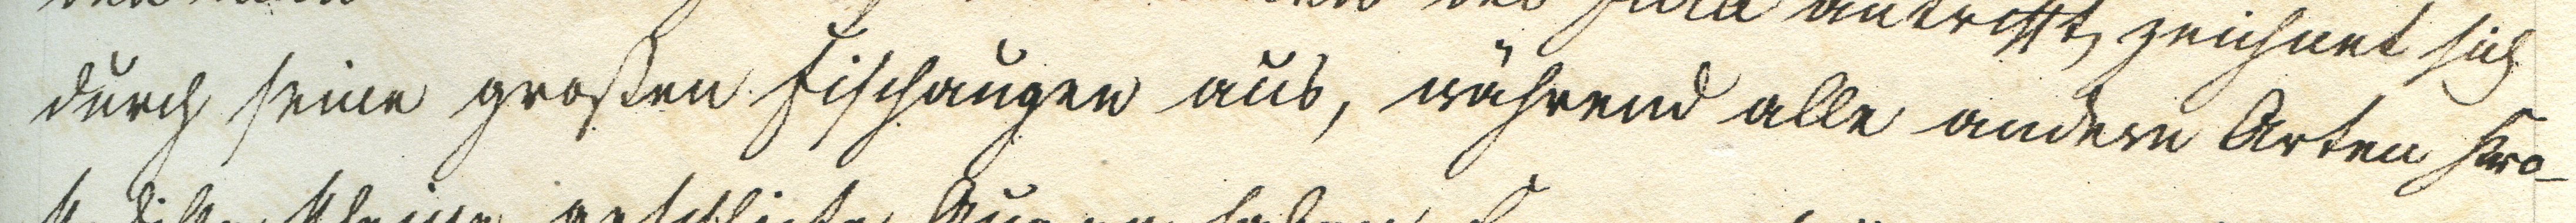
durch seine großen Fischaugen aus, während andere Arten Kro-
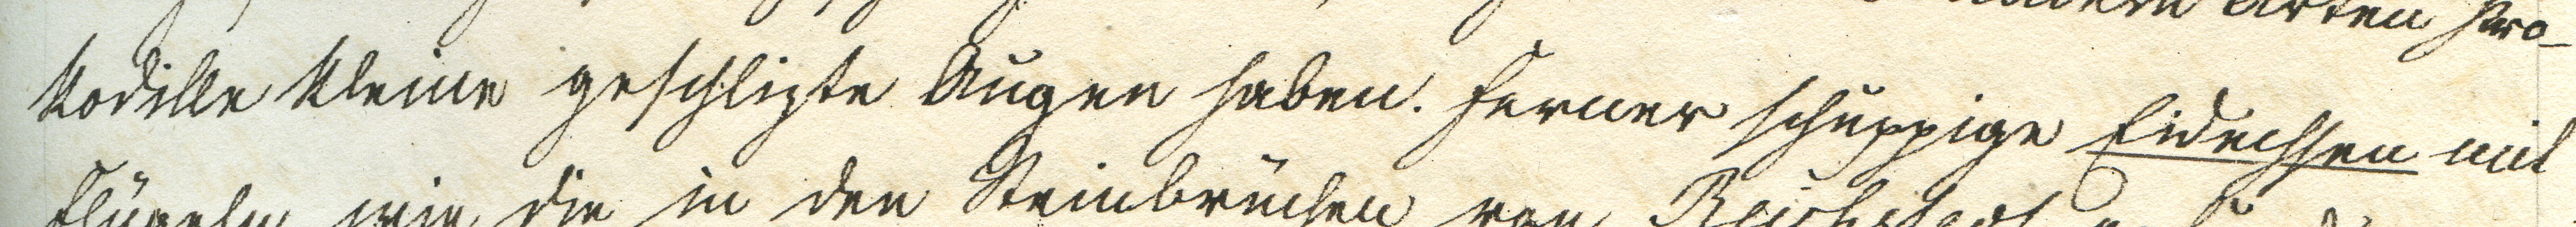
kodille kleine geschlitzte Augen haben. Ferner schuppige Eidechsen mit
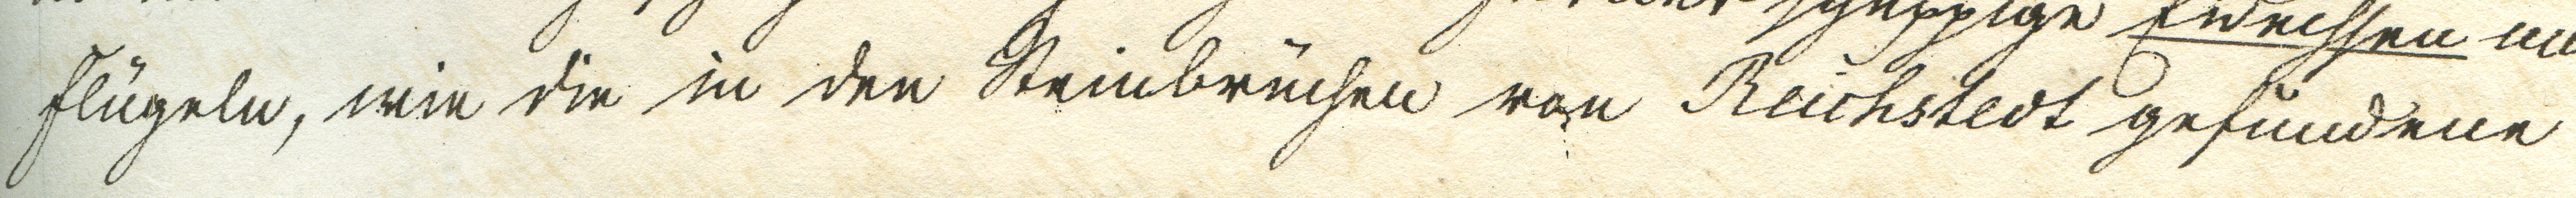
Flügeln, wie die in den Steinbrüchen von Reichstedt gefundene
